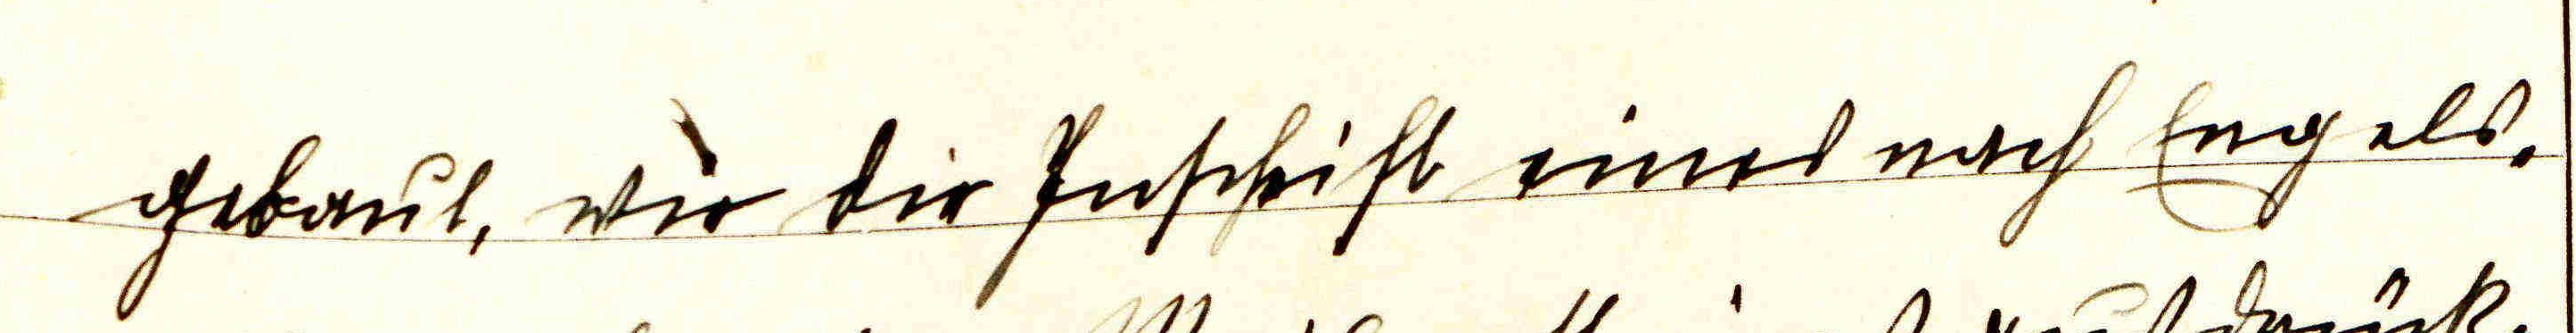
gebaut, wie die Inschrift eines nach Engels-
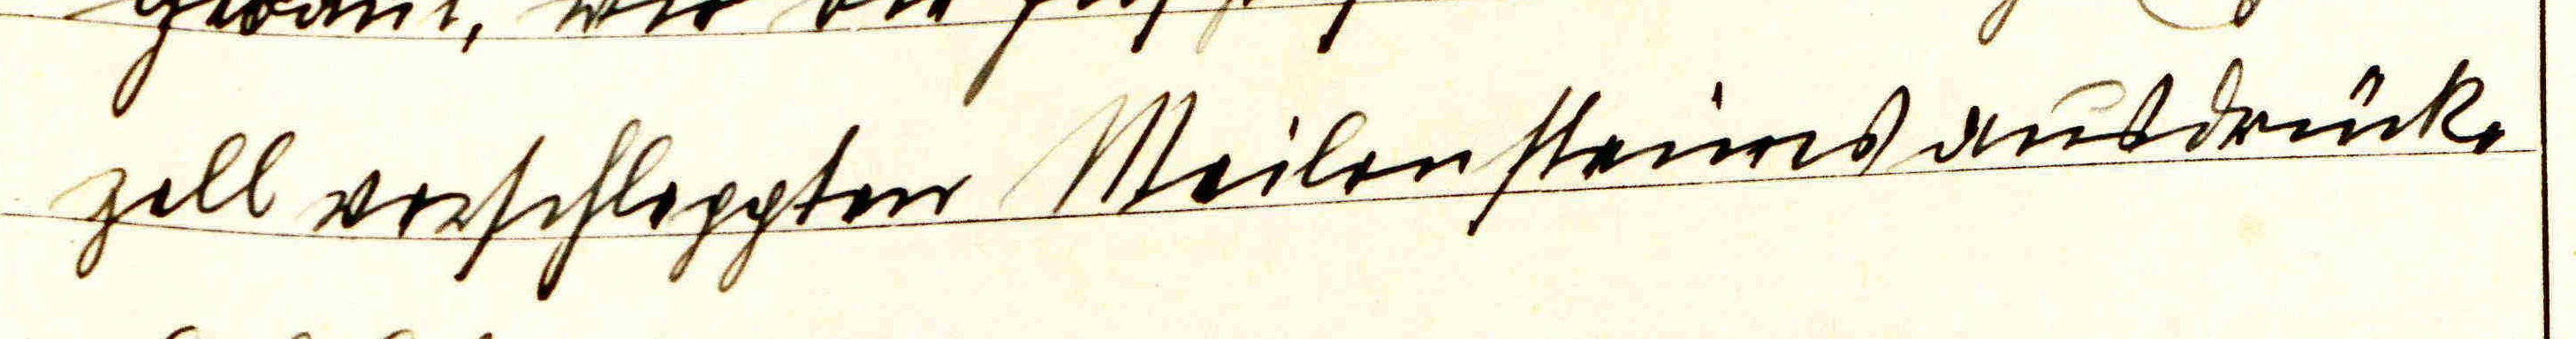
zell verschleppten Meilensteines ausdrück-
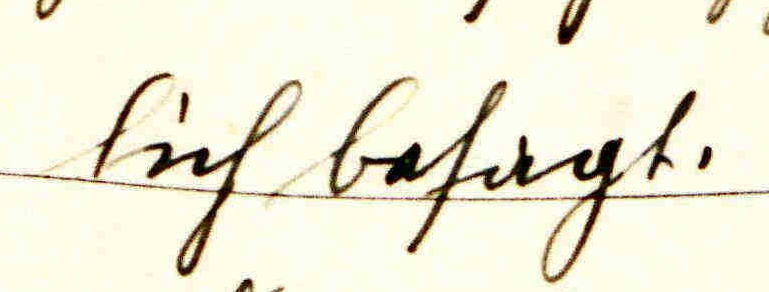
lich besagt.
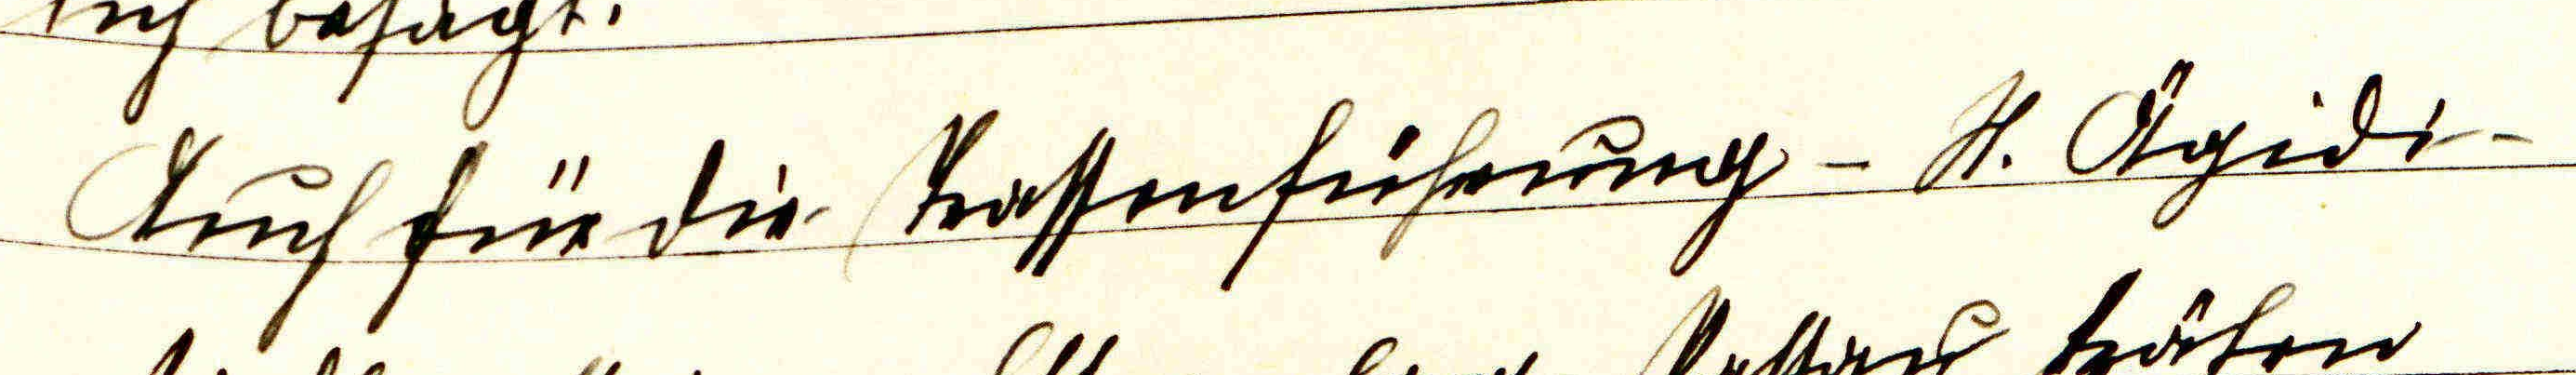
Auch für die Trassenführung – St.Aegidi -
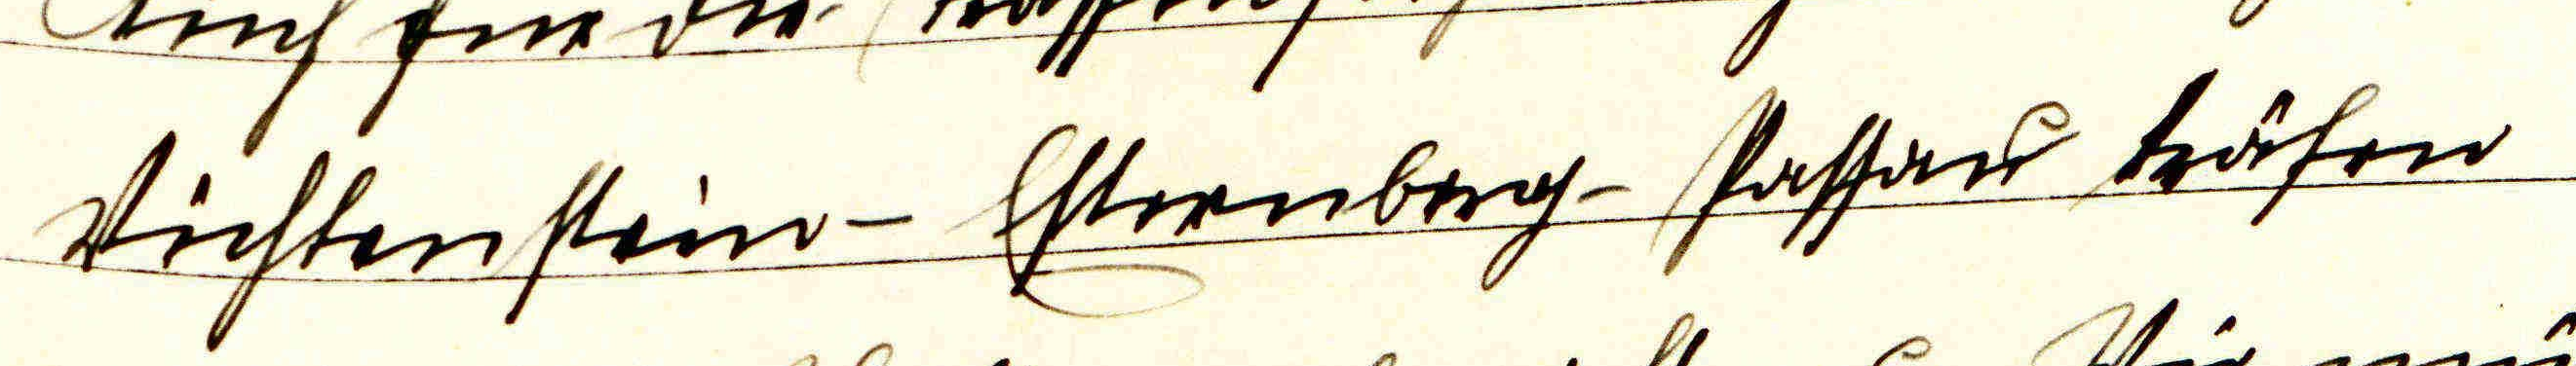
Vichtenstein – Esternberg – Passau träfen
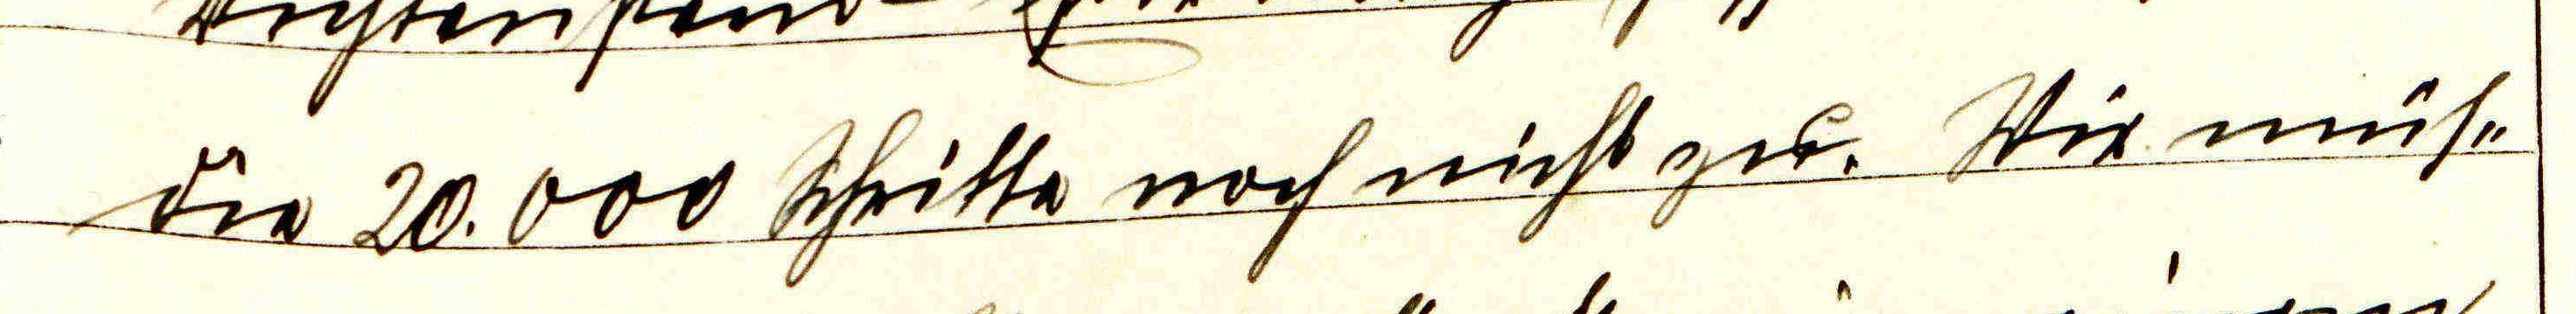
die 20.000 Schritte noch nicht zu. Wir müs-
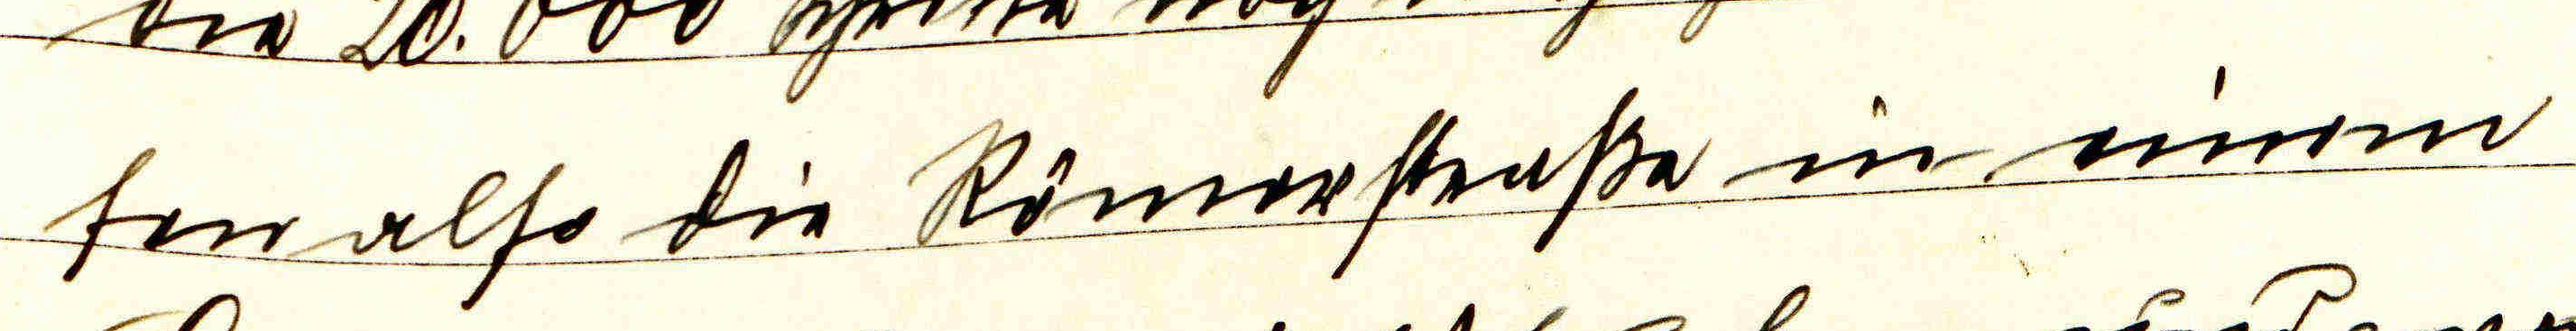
sen also die Römerstraße in einem
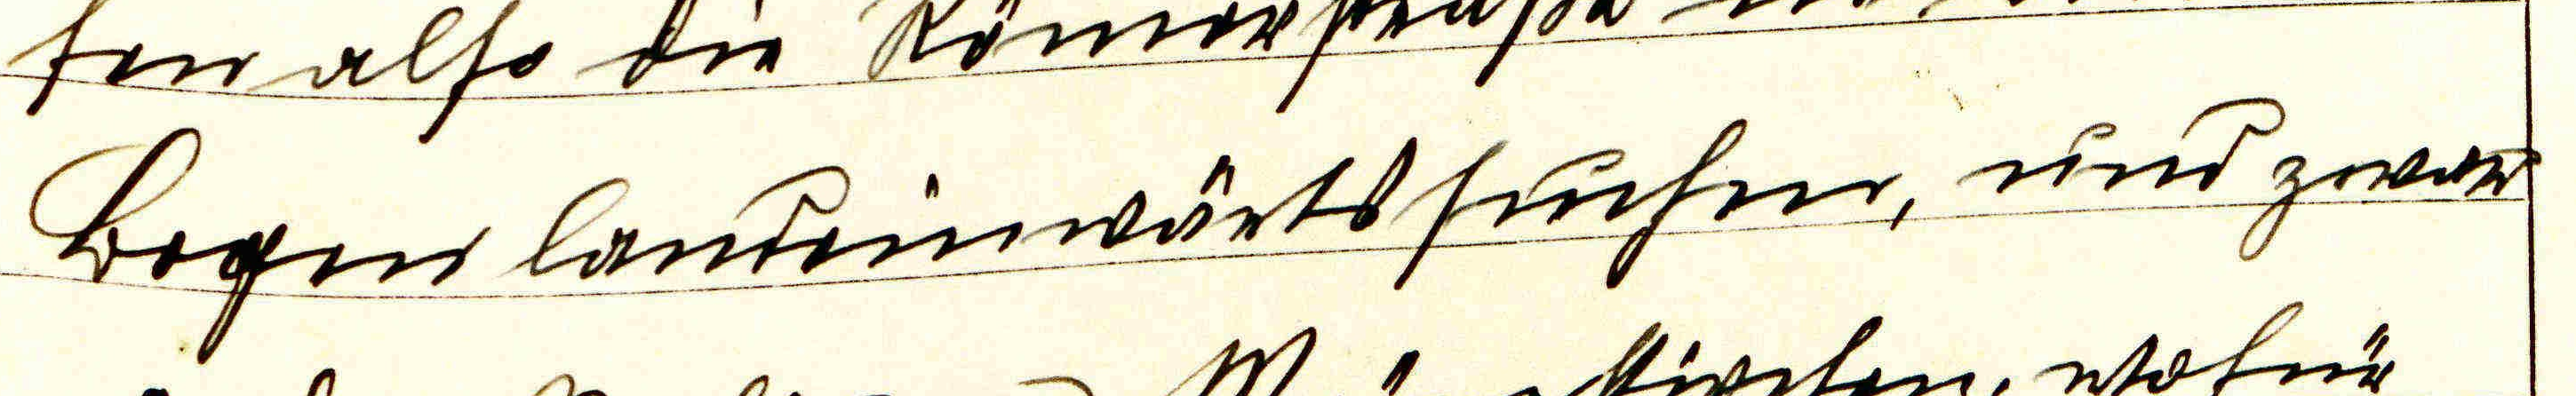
Bogen landeinwärts suchen, und zwar
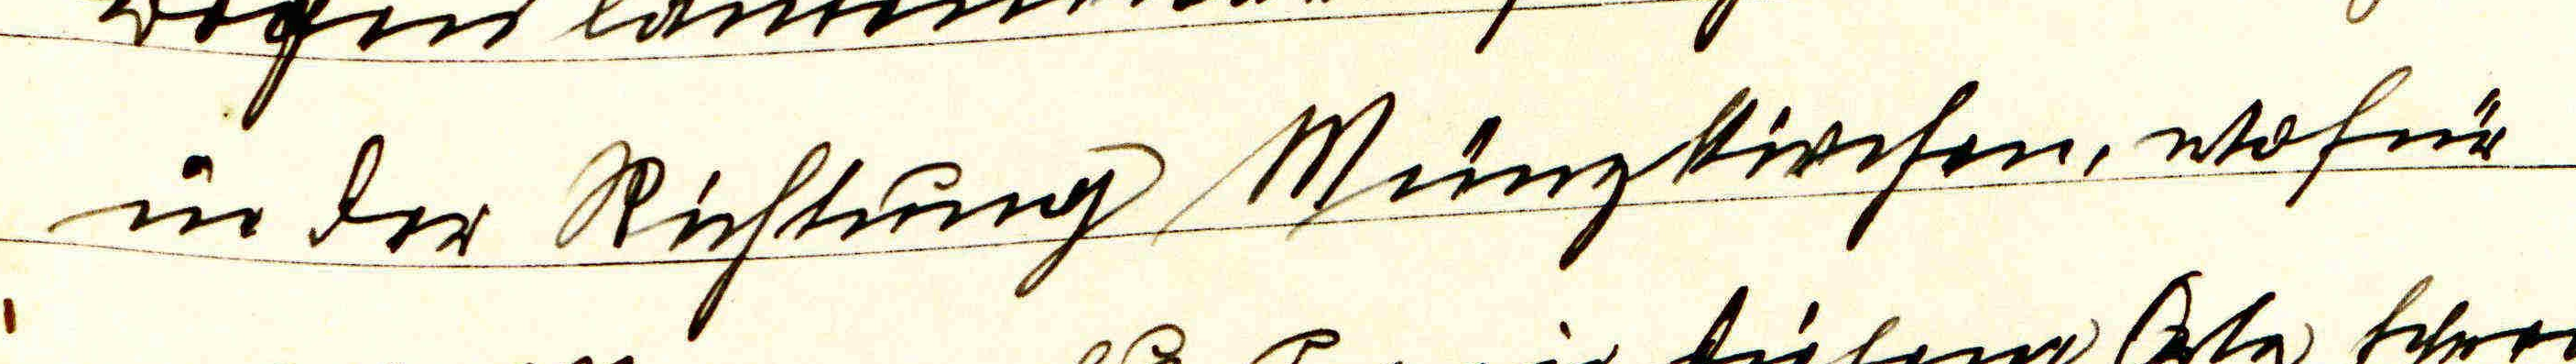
in der Richtung Münzkirchen, wofür
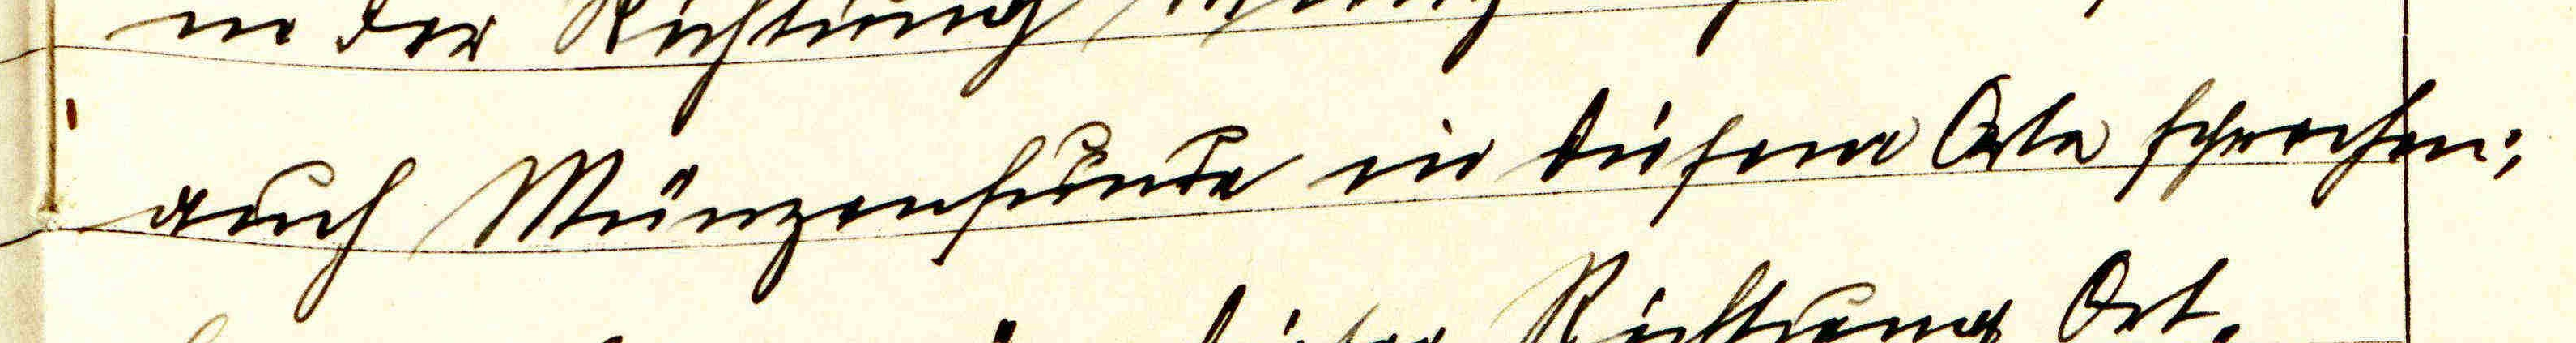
auch Münzenfunde in diesem Orte sprechen;
